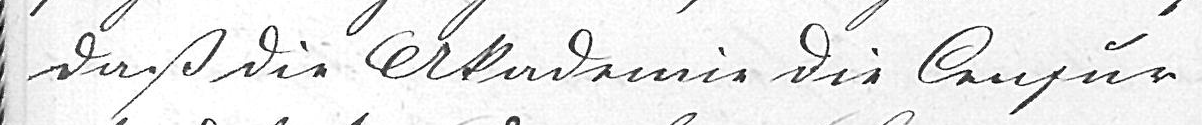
daß die Akademie die Censur
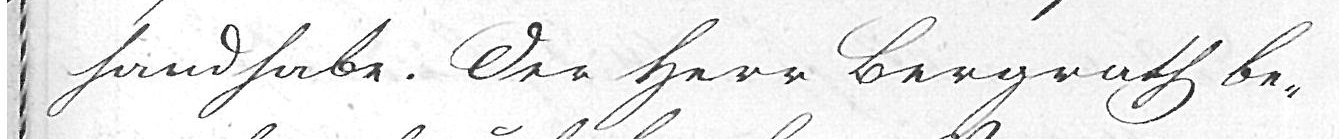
handhabe. Der Herr Bergrath be-
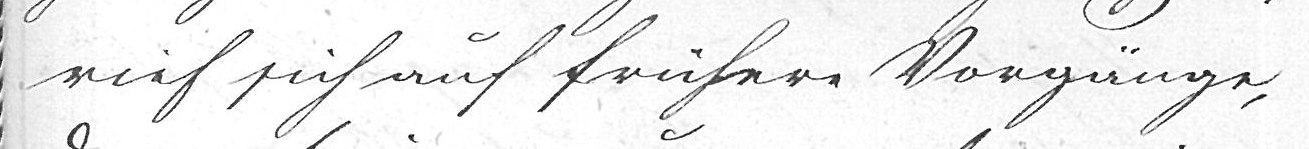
rief sich auf frühere Vorgänge
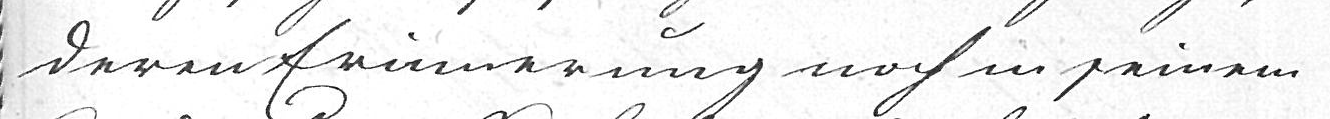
deren Erinnerung noch in seinem
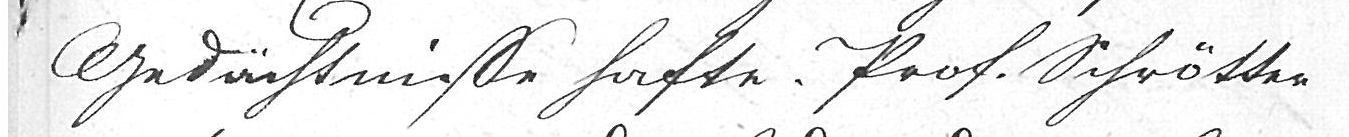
Gedächtnisse hafte Prof. Schrötter
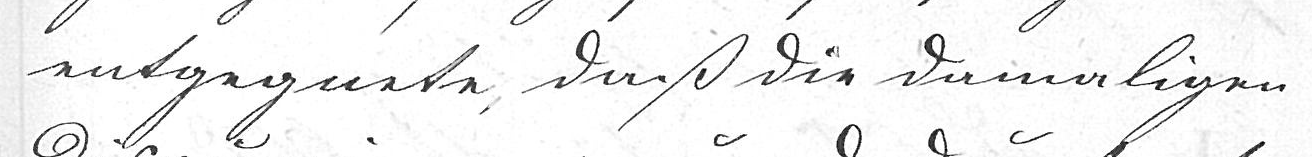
entgegnete, daß die damaligen
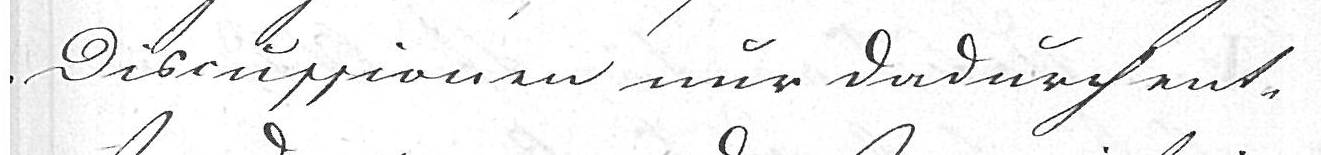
Discussionen nur dadurch ent.
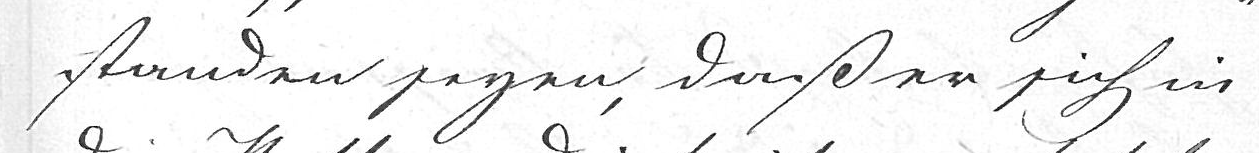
standen seyen, daß er sich in
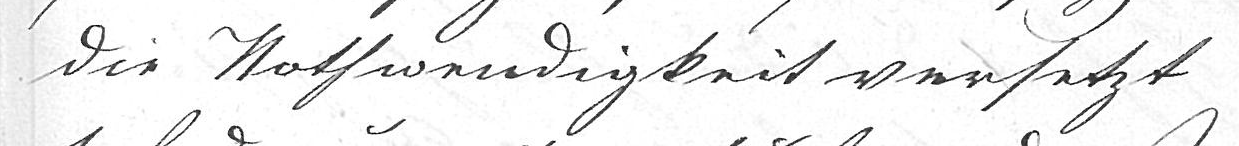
die Nothwendigkeit versetzt
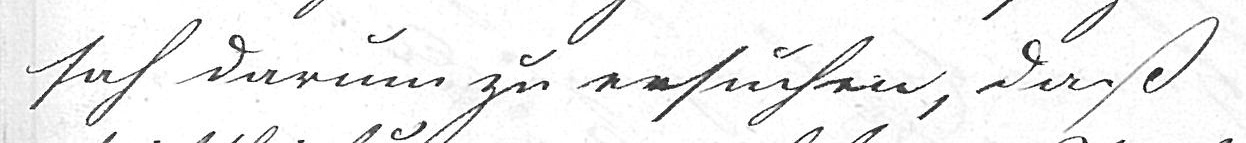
sich darum zu ersuchen daß
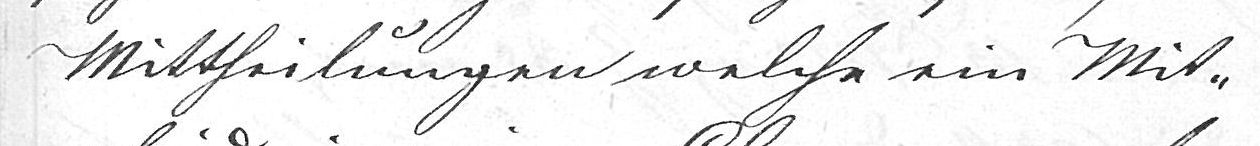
Mittheilungen, welche ein Mit-
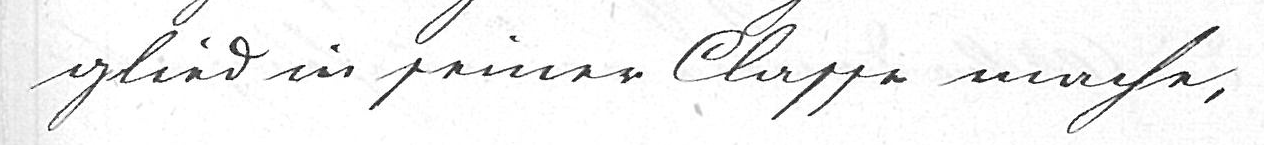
glied in seiner Classe mache,
